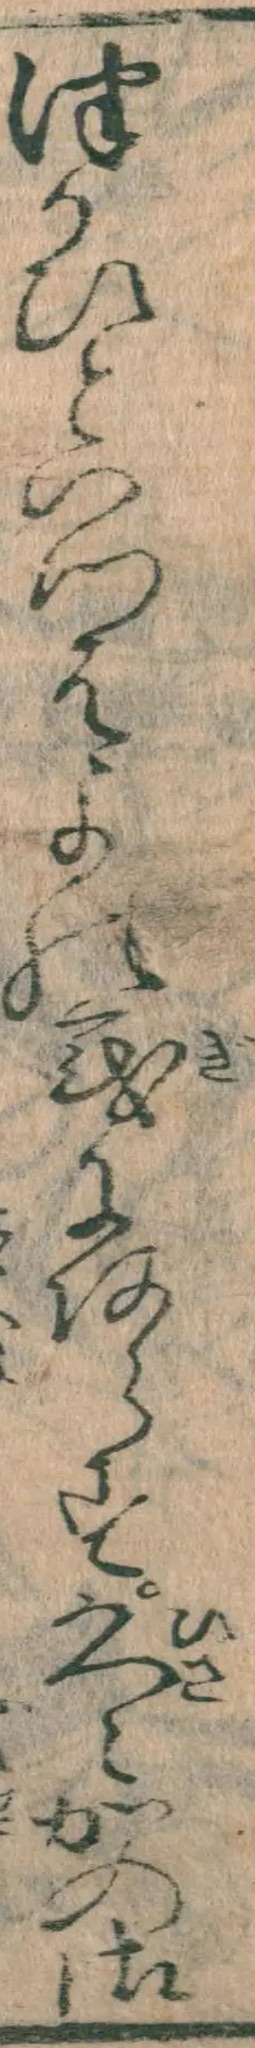つかひといつはよの義にあらす。久々かの御
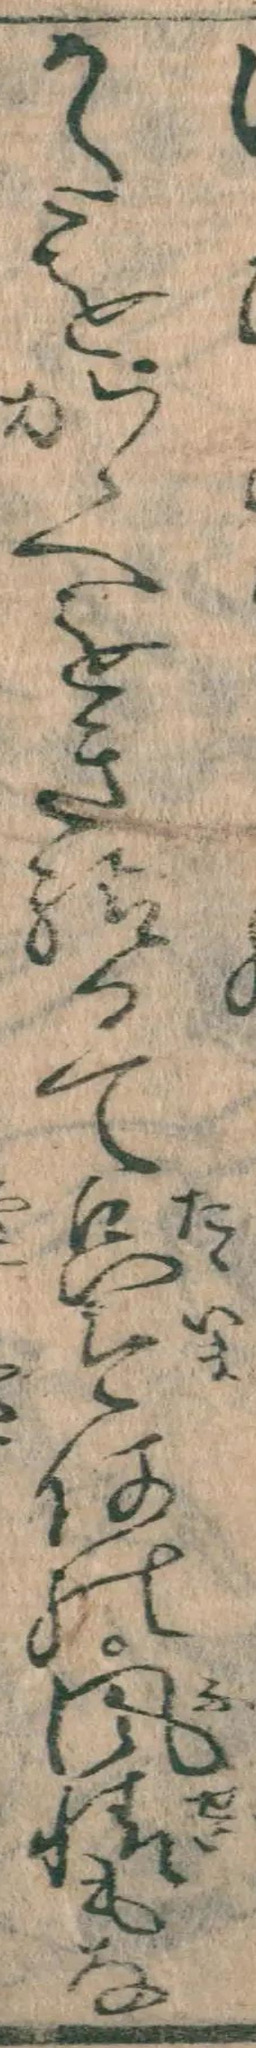かたを、かゝへをき給ひて只今何の。風情もな
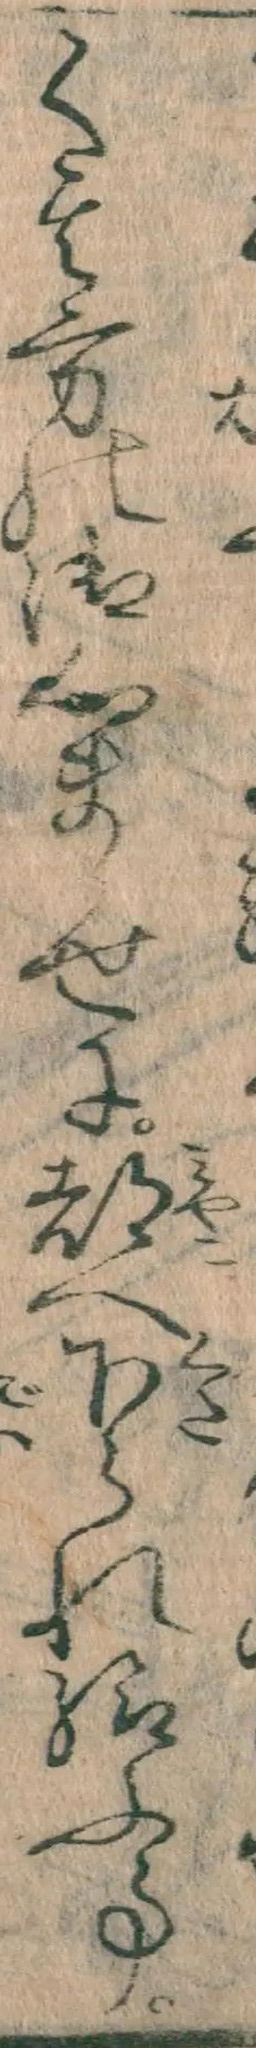く其方の御心まかせに。都へ下られ給ふ事。
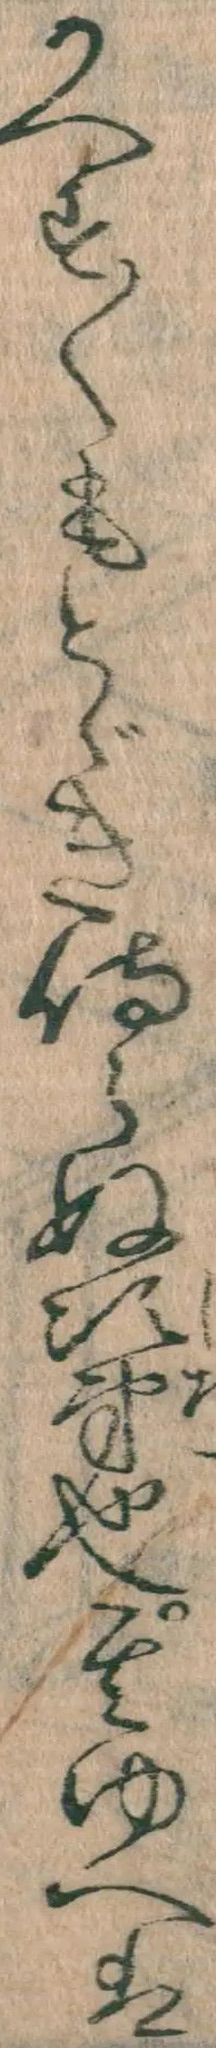かへす〳〵もとゞき侍らぬ次第也。其ゆへは
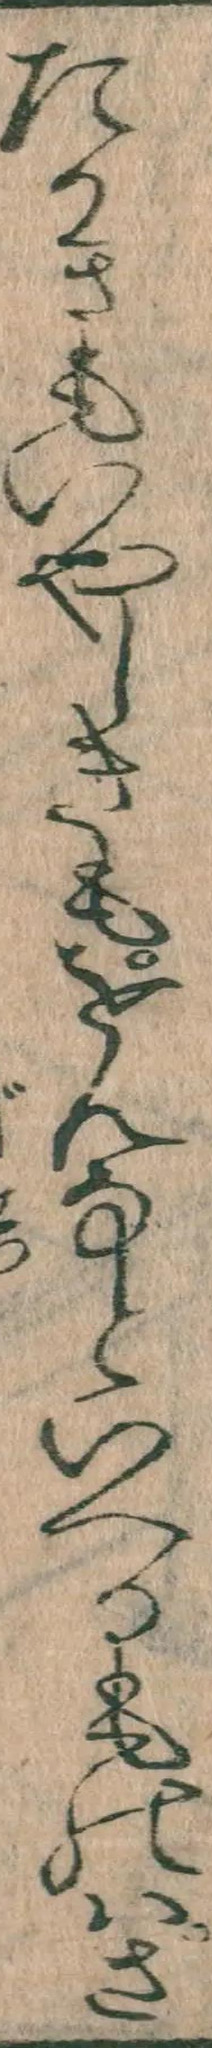たかきもいやしきも。をんなといへるものは。さ
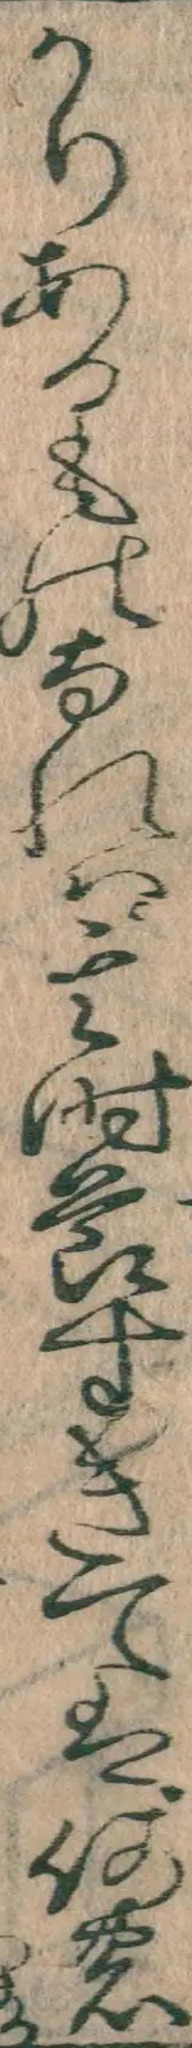かりあるものなれは。其時節すきては、何の
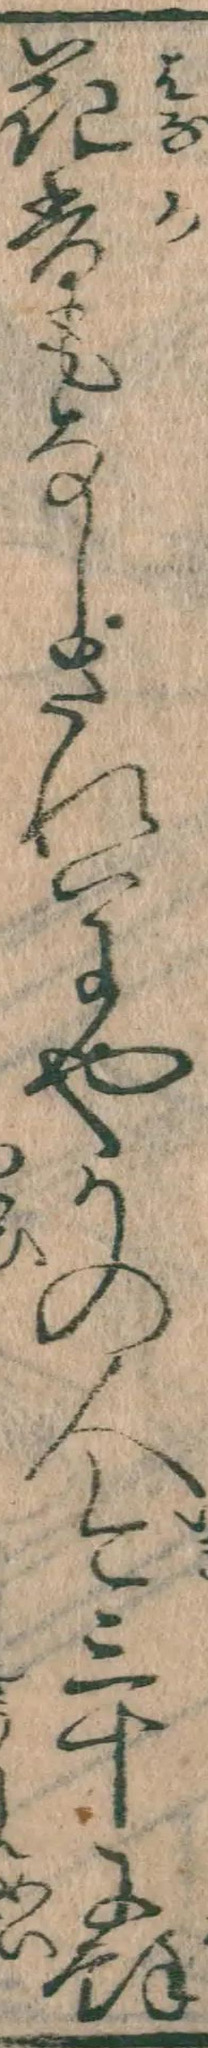花香もなし、されはにやかの人今三十に余
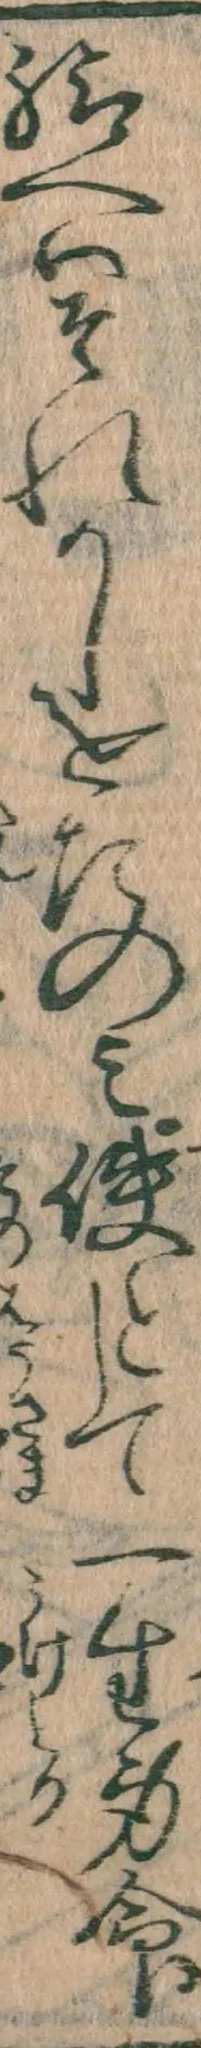給へはそれかしをたのみ、使として一生身命
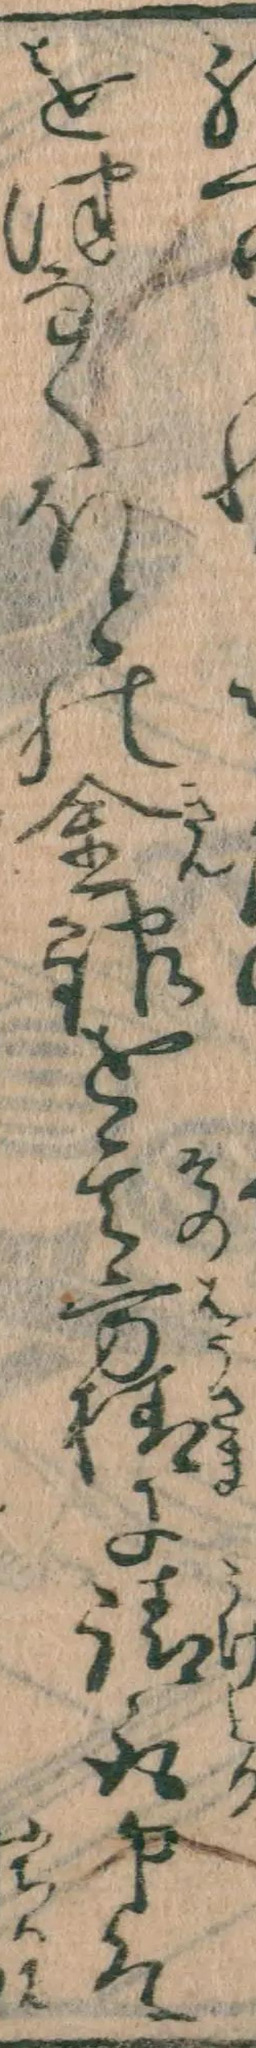をつなくほとの金銀を其方様に請取申そ
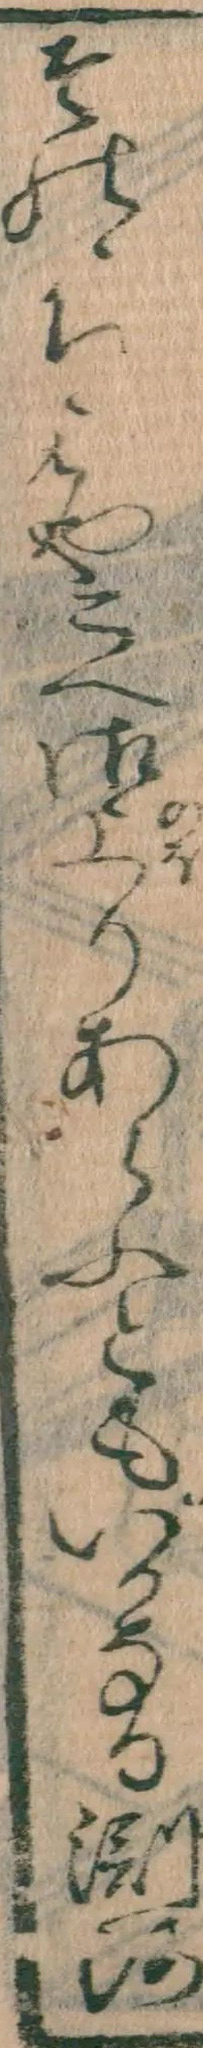そのゝちみやこへ御上りあらふとも。いかなる淵河
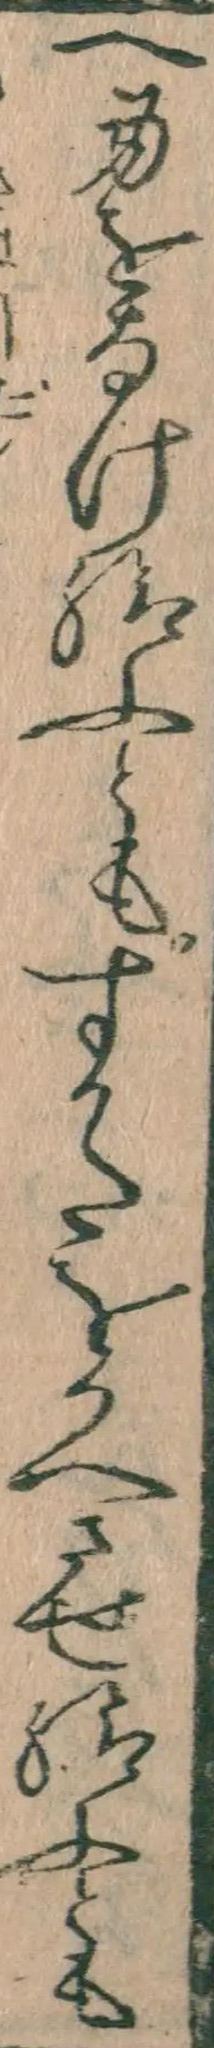へ身をなけ給ふとも。すかたをかへさせ給ふとも
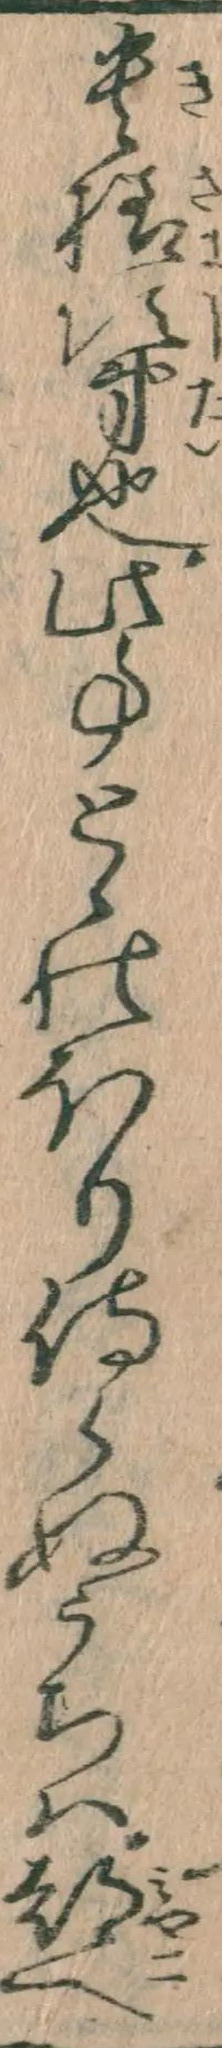貴様次第也、此事とゝのほり侍らぬうちは、都へ
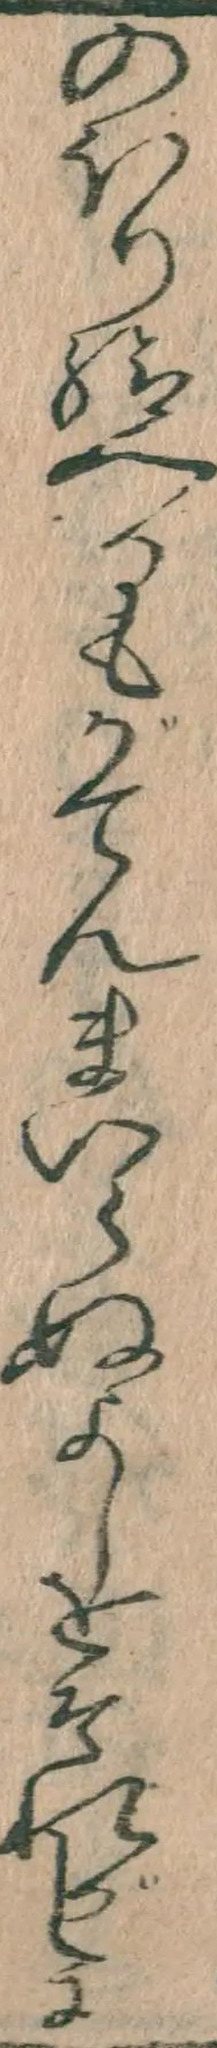のほり給へるもがてんまいらぬよしをそれがしに
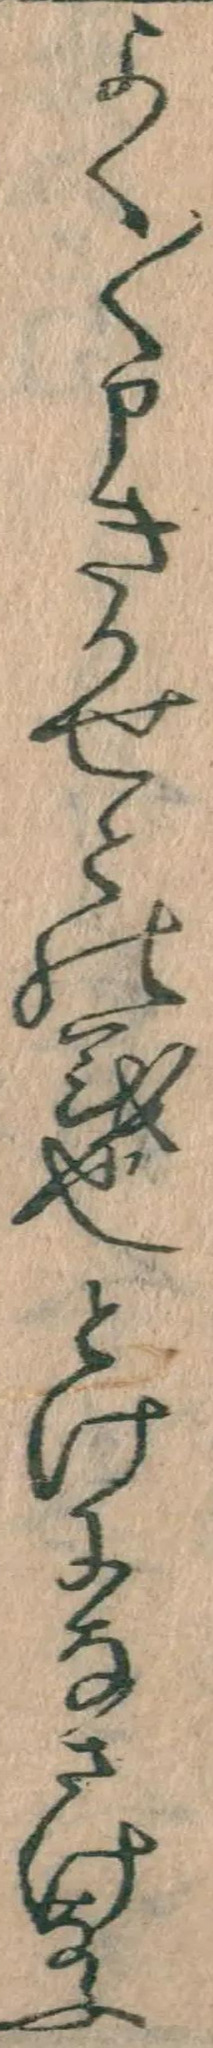よく〳〵申きかせとの義也とけになさけなふ
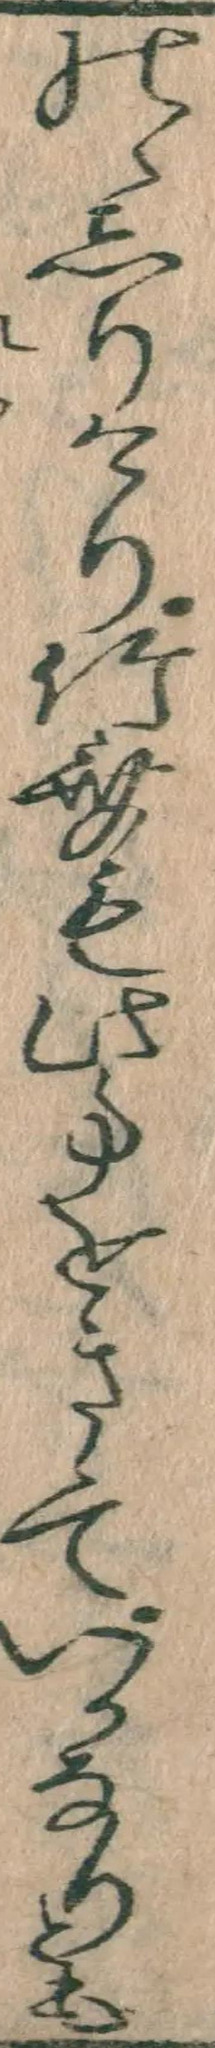のゝしりけり、竹斎も此事をきゝて、いかなりとも
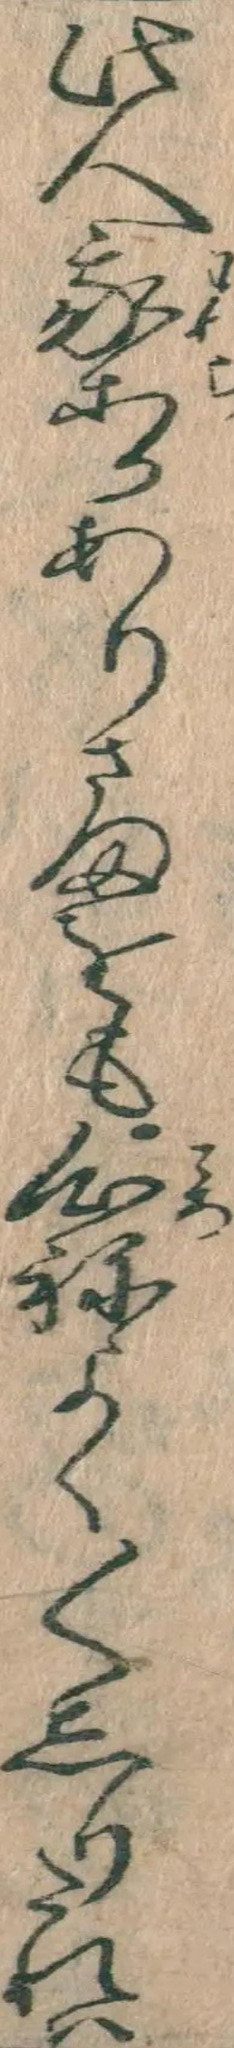此人我等かありさまをも、心ねよく〳〵しりたれは
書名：竹斎狂歌物語 3巻
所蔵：国立国会図書館 National Diet Library, JAPAN
